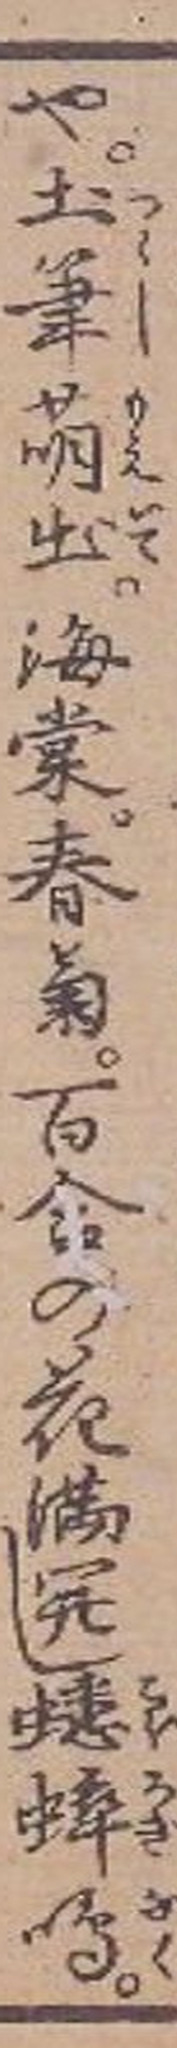や。土筆萌出。海裳。春菊。百合の花満開し蟋蟀鳴。
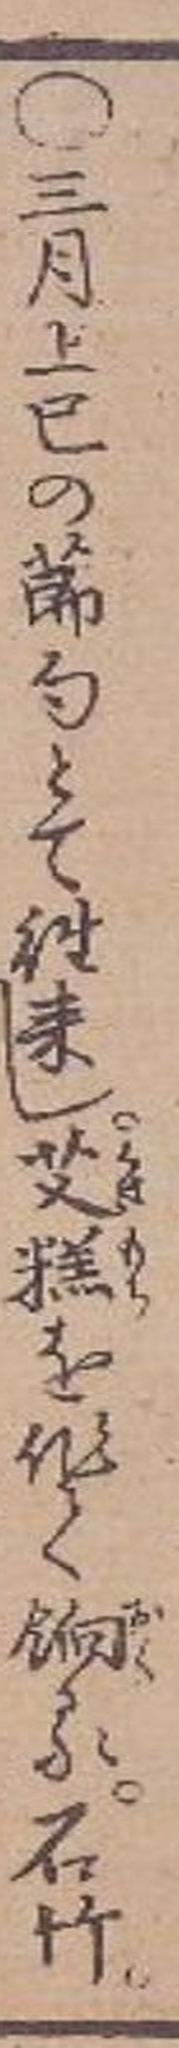〇三月上巳の節句とて往来し。艾糕を作て餉る。石竹。
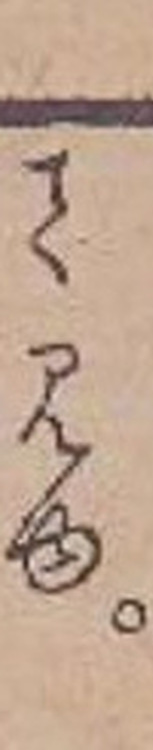て見ゆ。
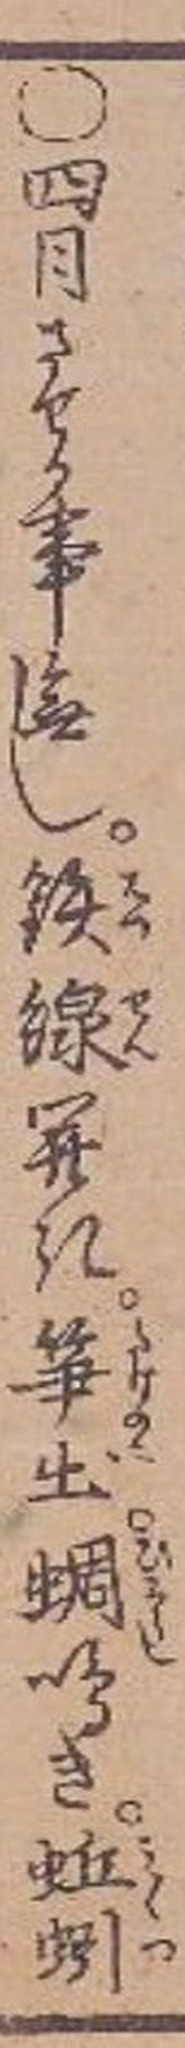〇四月させる事無し。鉄線開き。笋出。蜩鳴き蚯蚓
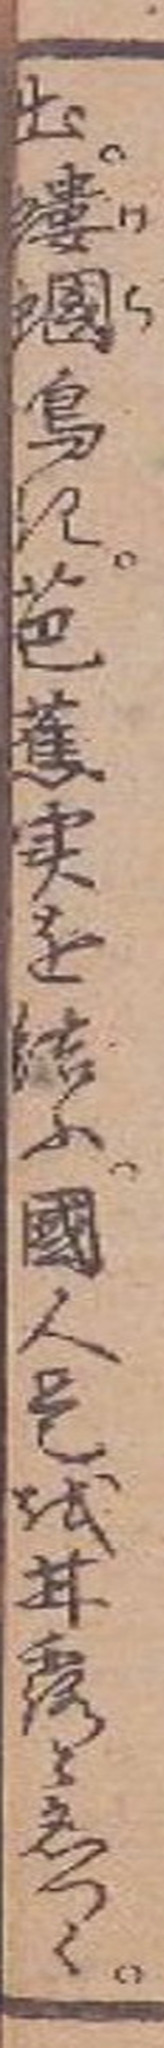出。螻蟈鳴き。芭蕉実を結ふ。国人是を露と名つく。
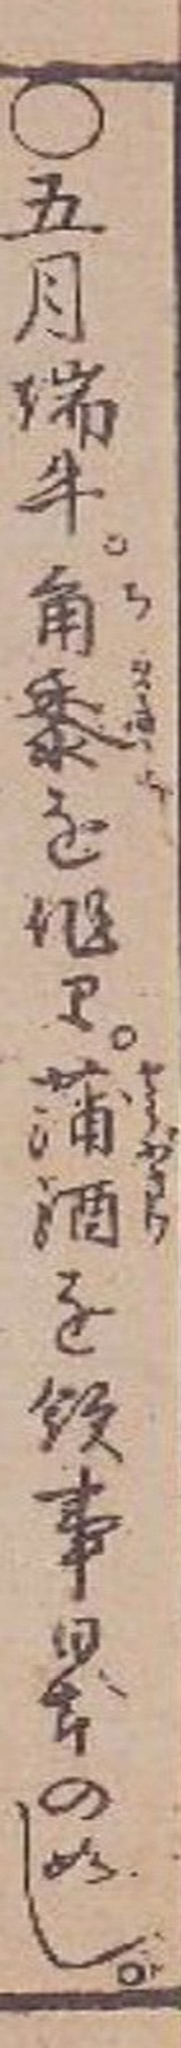〇五月端午。角黍を作り。蒲酒を飲事日本の如し。
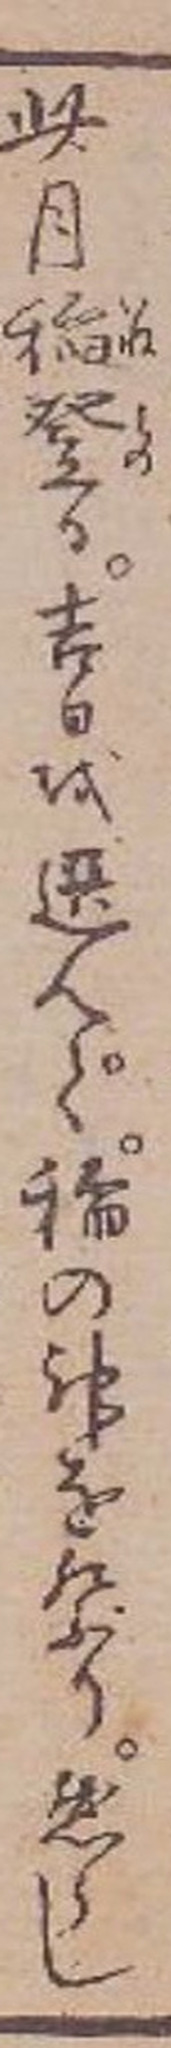此月稲登る。吉日を選んて。稲の神を祭り。然うし
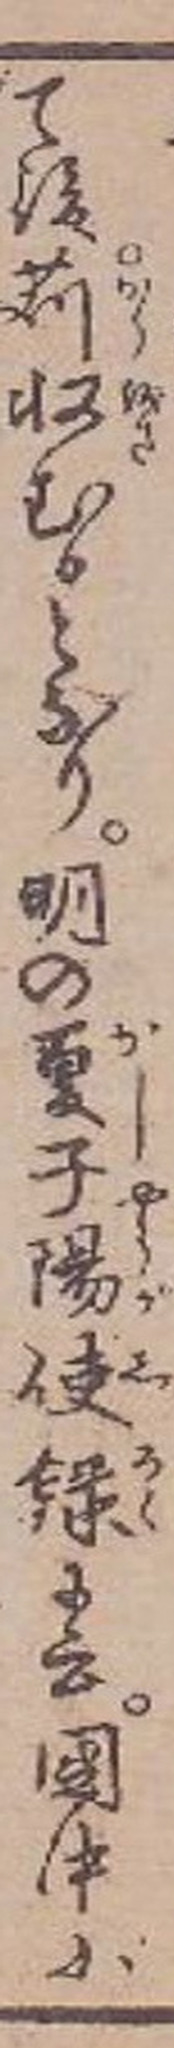て後。苅収むるとなり。明の夏子陽使録に云。国中に
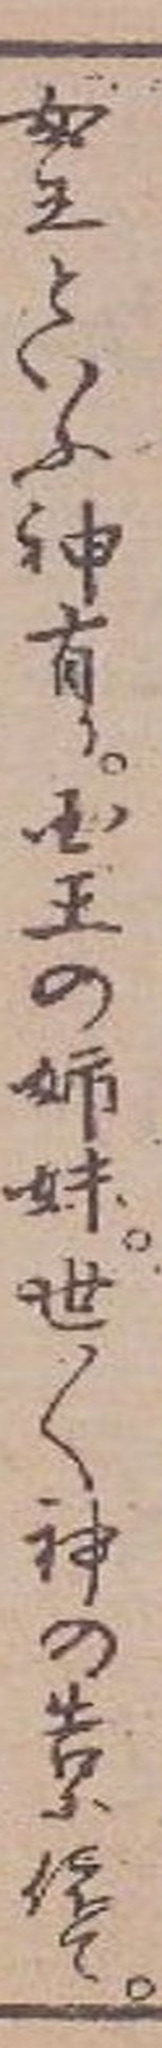女王といふ神有り。国王の姉妹世〳〵神の告に依て。
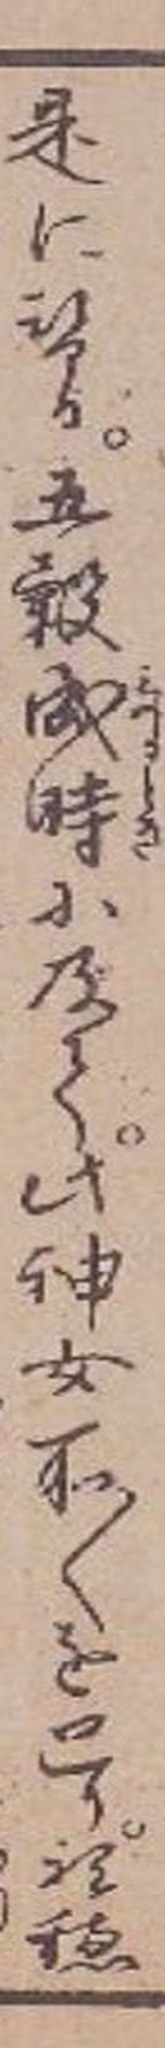是に替る。五穀成時に及て此神女所〳〵を廻り。稲穂
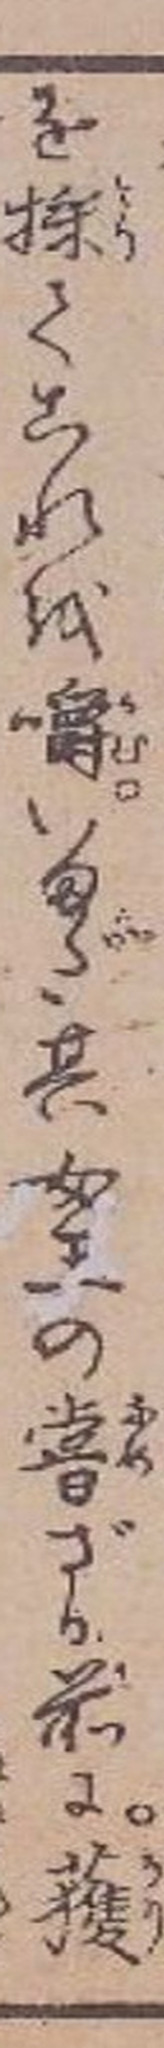を採てこれを嚼。いまだ其女王の嘗ざる前に。穫
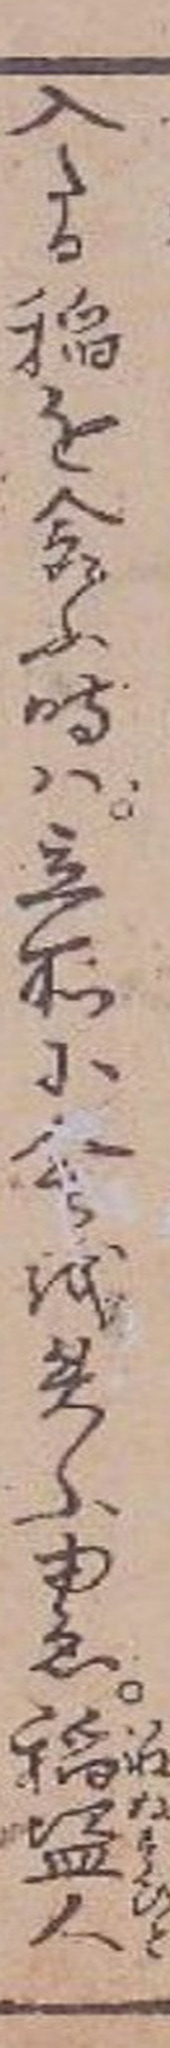入たる稲食ふ時は立所に命を失ふゆゑ。稲盗人
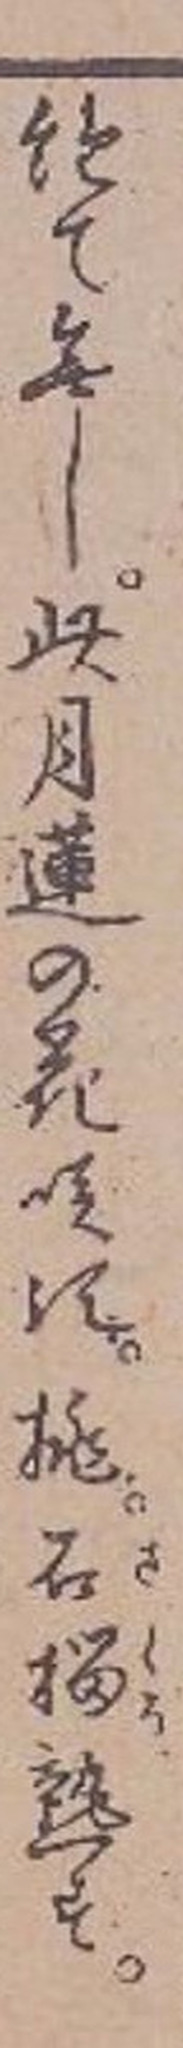絶えて無し。此月蓮の花咲き。桃。石榴熟す。
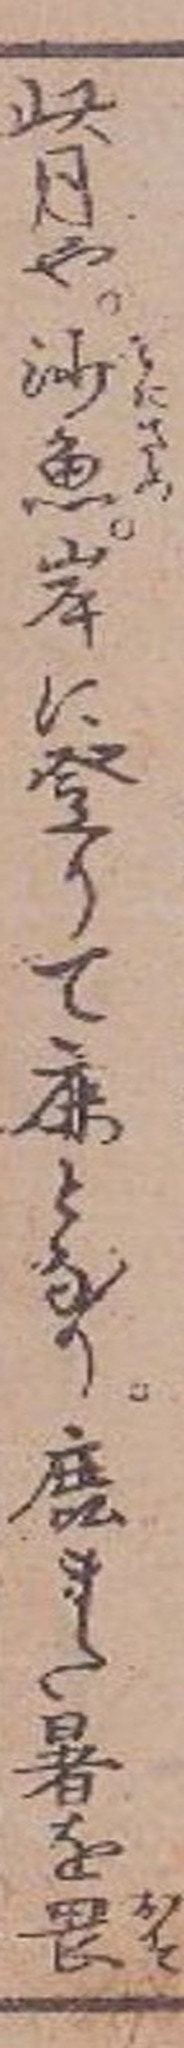此月や。沙魚。岸に登りて鹿となり。鹿また暑を畏

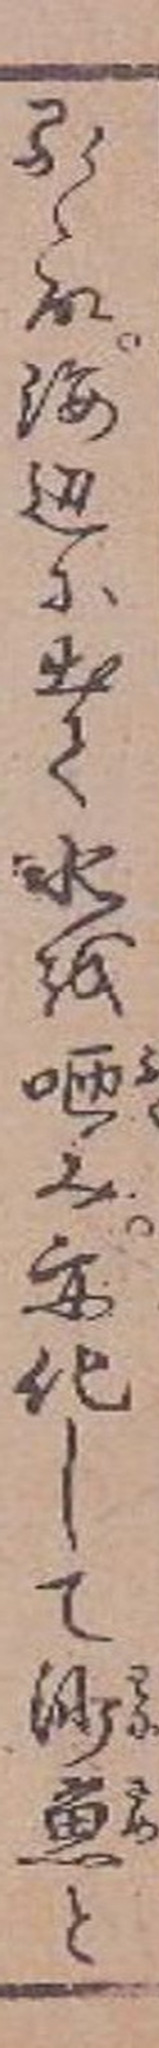るゝ故。海辺に出て氷を咂み。亦化して沙魚と
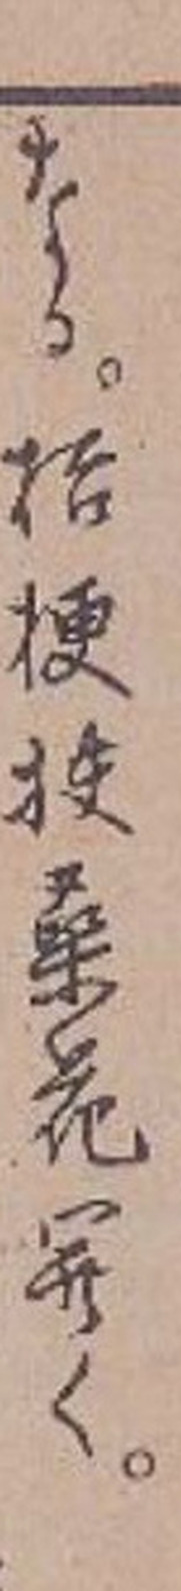なる。桔梗扶桑花開く。
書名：琉球談
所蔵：University of the Ryukyus Library
